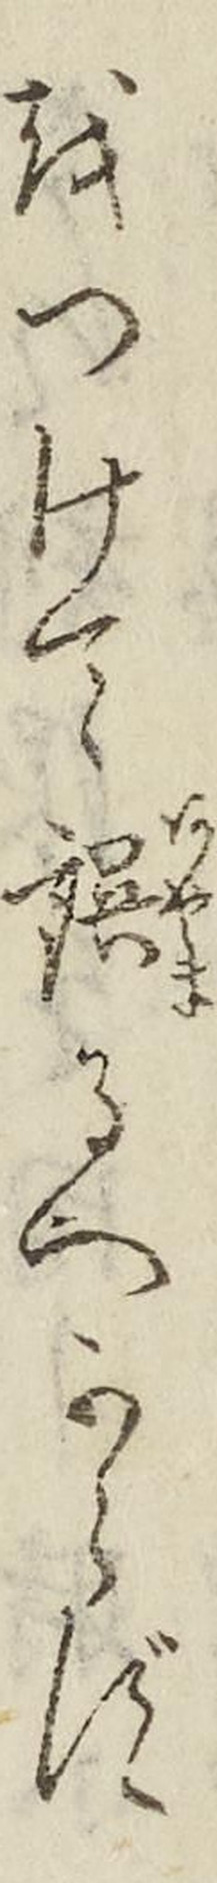をつけて誤るへからず
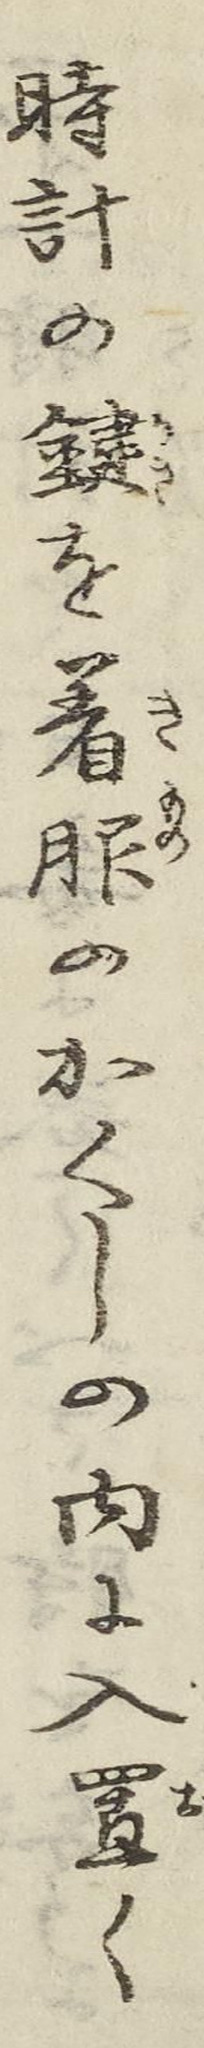時計の鍵を着服のかくしの内に入置く
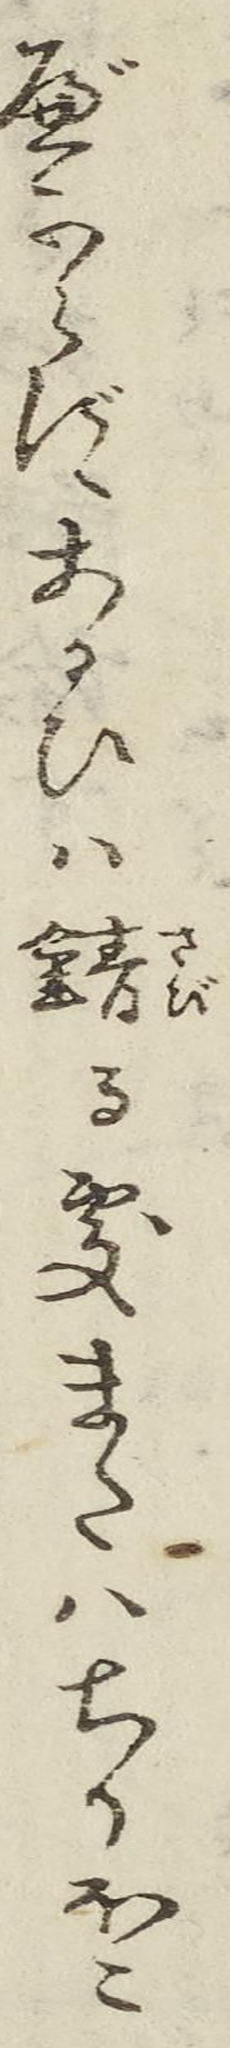べからずあるひは錆る処またはちりほこ
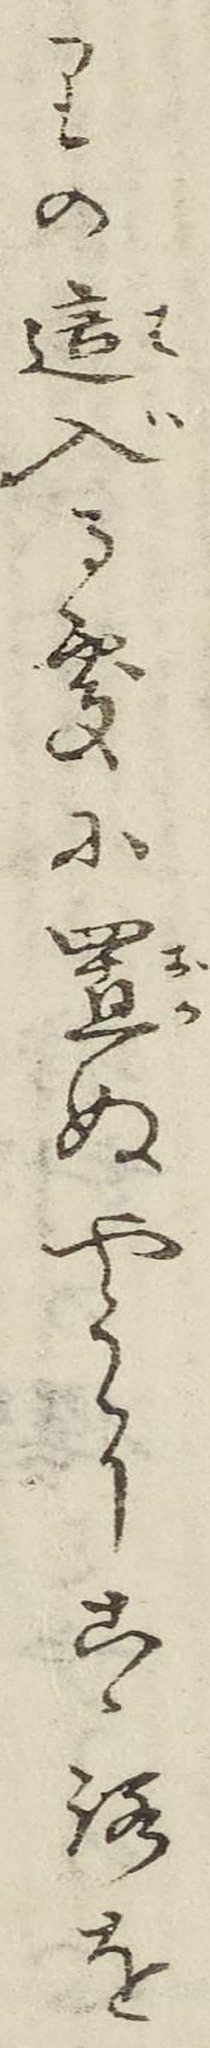りの這入る処に置ぬやうにこゝろを
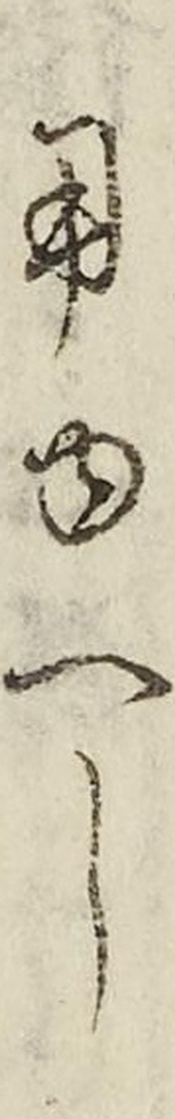用ゆへし
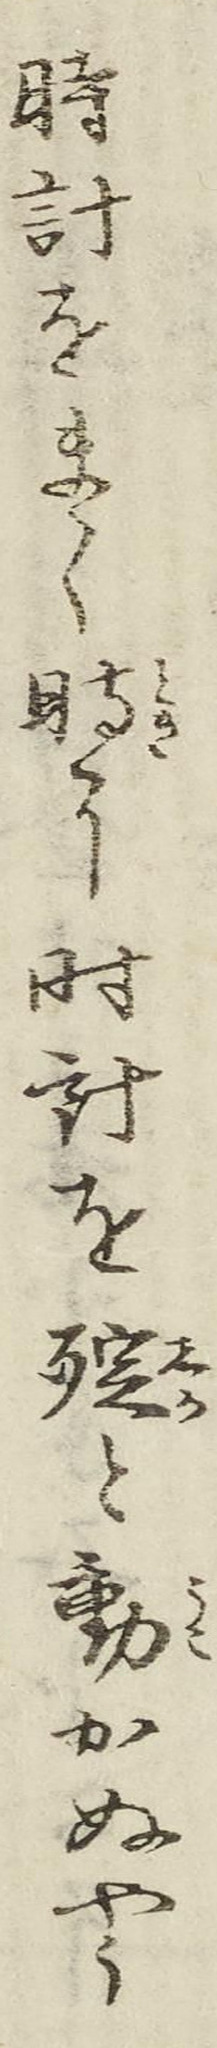時計をまく時に時計を聢と動かぬやう
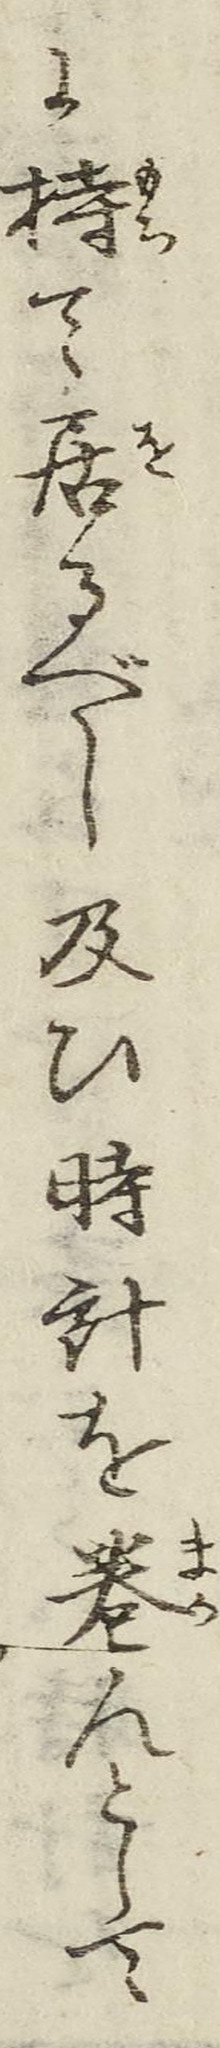に持て居るべし及ひ時計を巻んとして
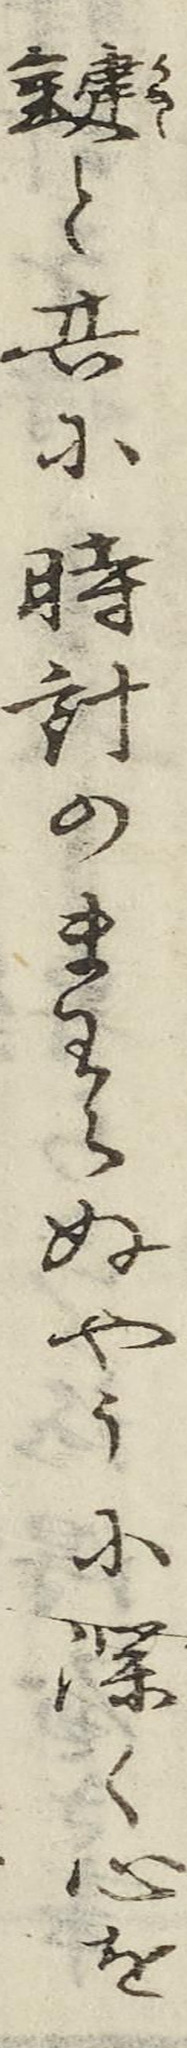鍵と共に時計のまわらぬやうに深く心を
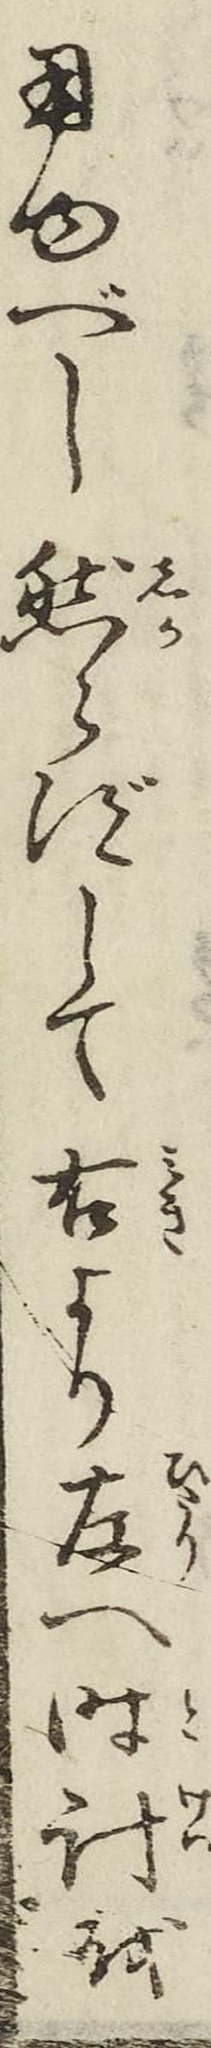用ゆべし然らずして右より左へ時計を
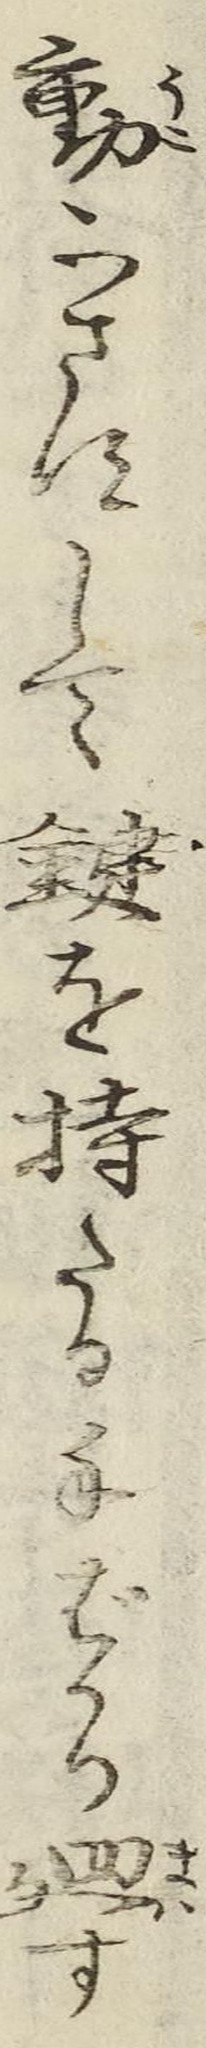動かさすして鍵を持たる手ばかり廻す
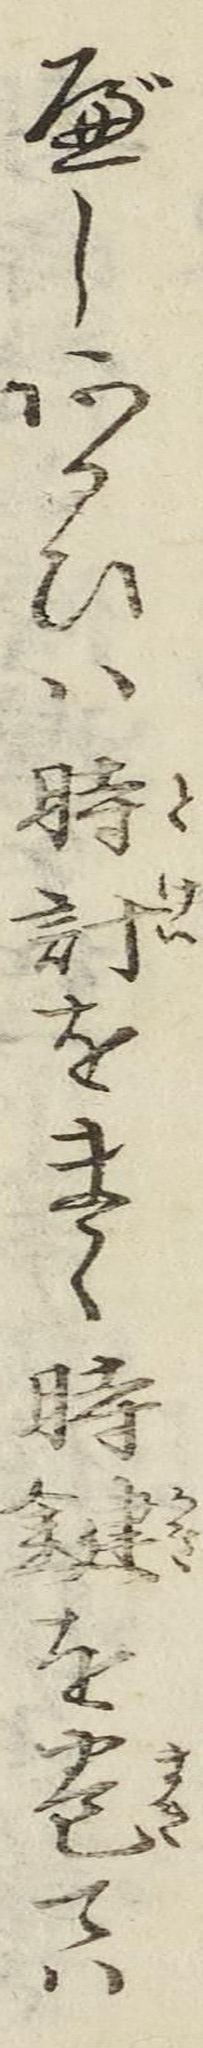べしあるひは時計をまく時鍵を巻ては
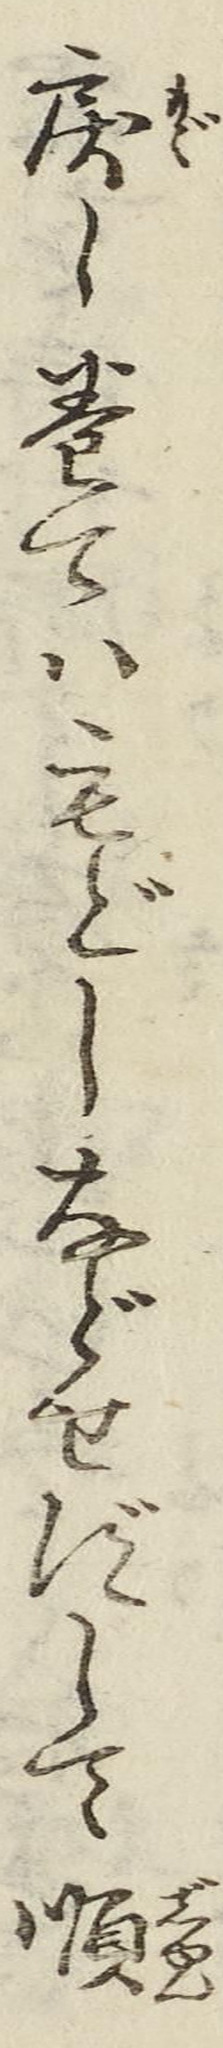戻し巻てはもどしなどせずして順
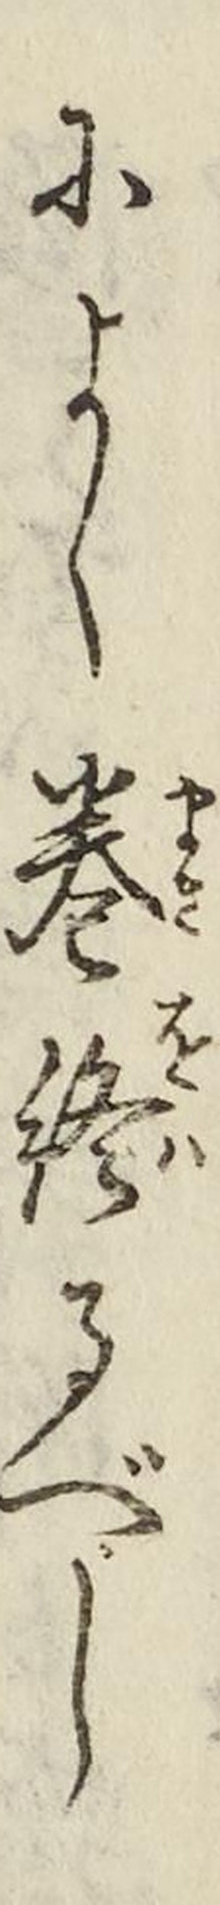によく巻終るべし
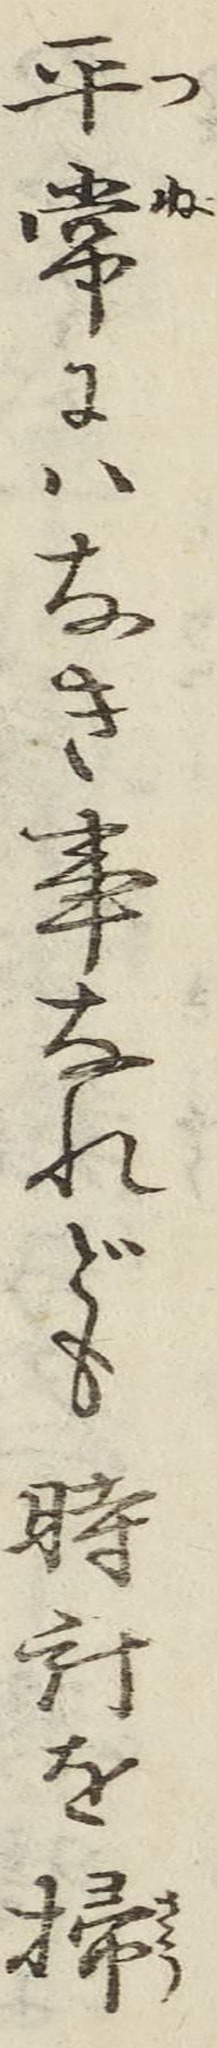平常にはなき事なれども時計を掃
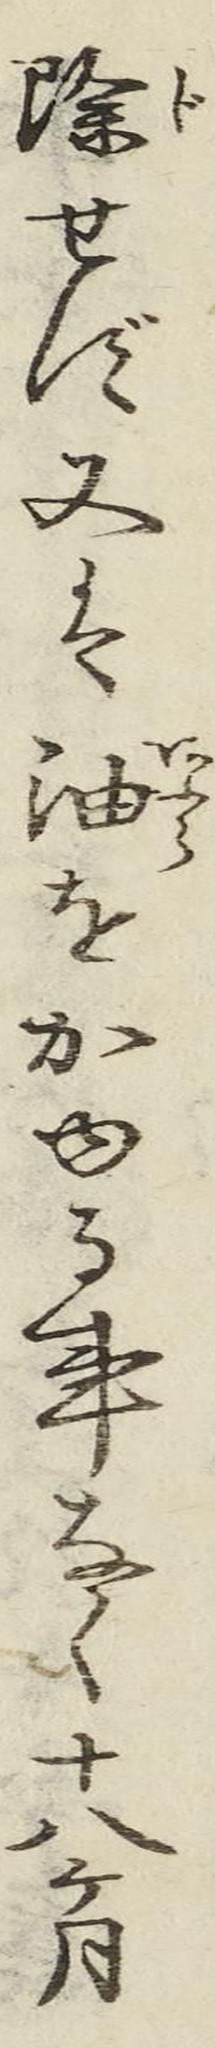除せず又は油をかゆる事なく十八ケ月
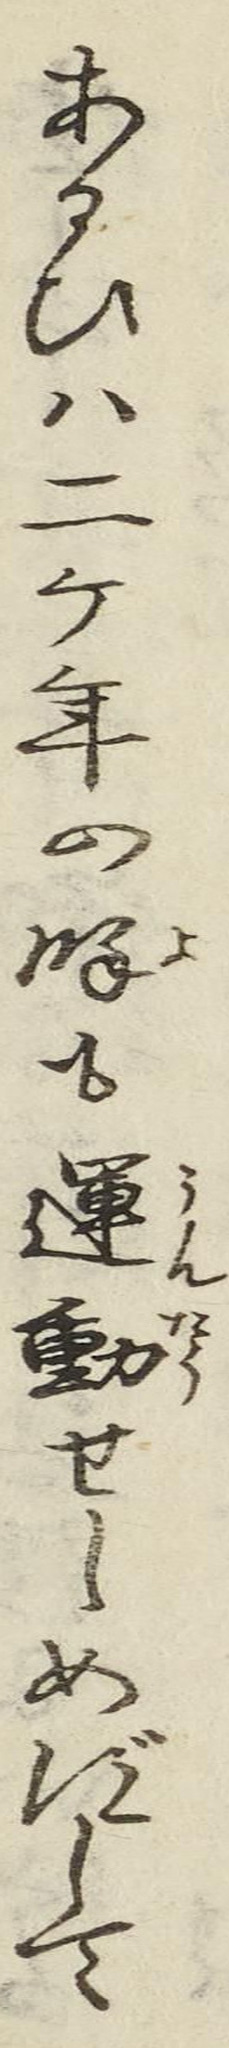あるひは二ケ年の余も運動せしめずして
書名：[時計に関する冊子]
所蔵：東京大学地震研究所図書室 Earthquake Research Institute Library, The University of Tokyo, JAPAN
